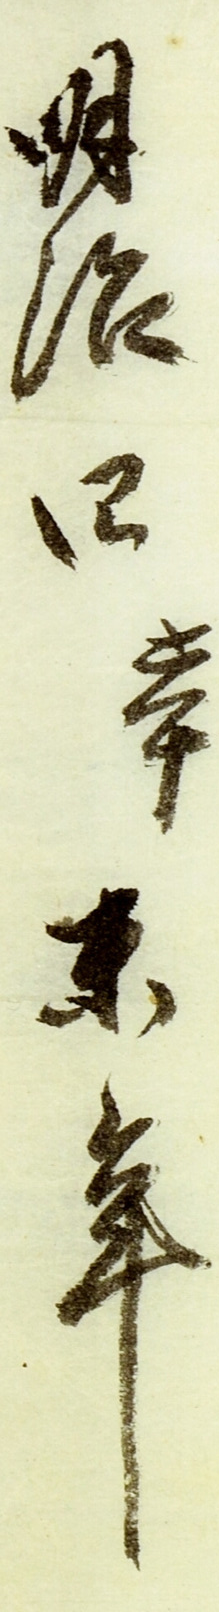明治四辛未年
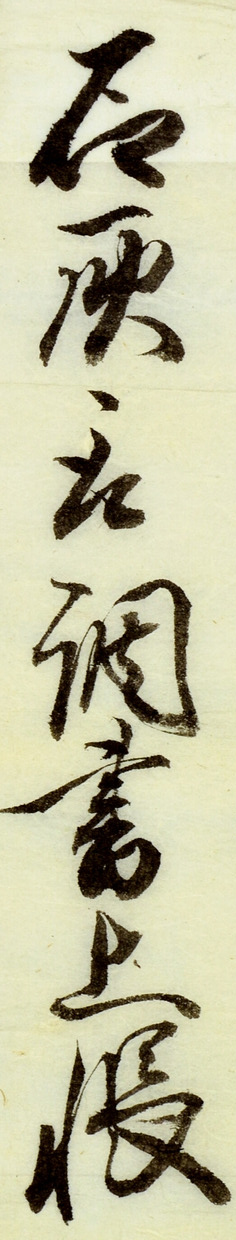石灰取調書上帳
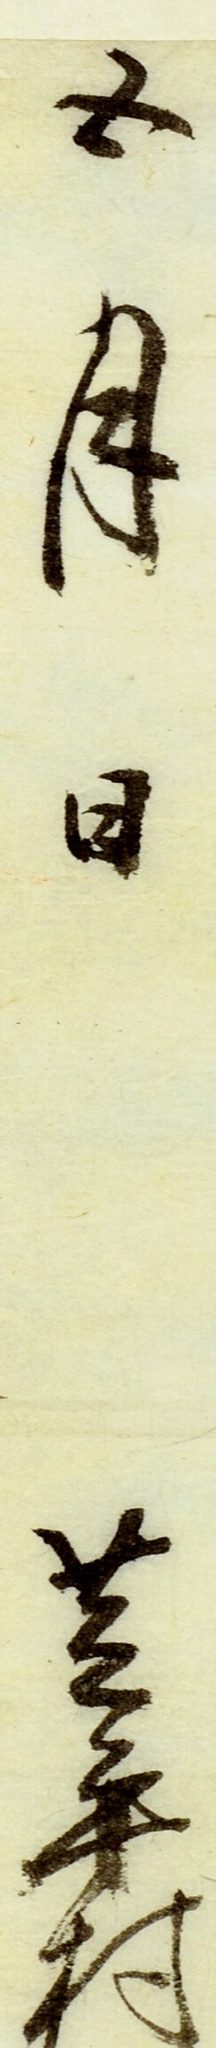五月日芝平村

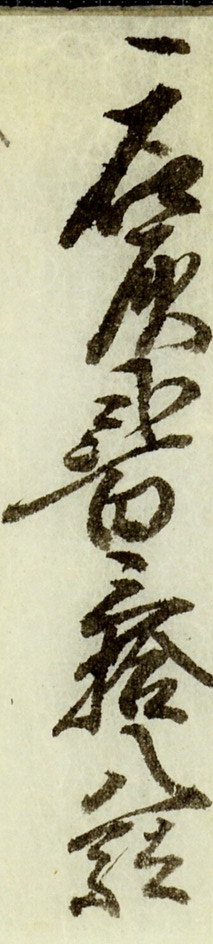一石灰弐百三拾八駄
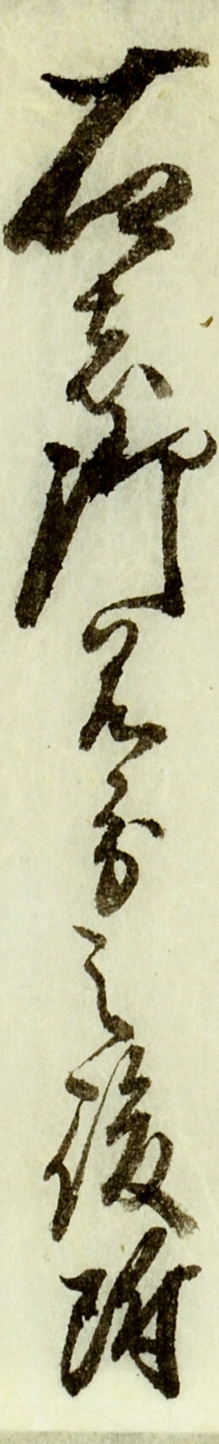右者御見分之後附
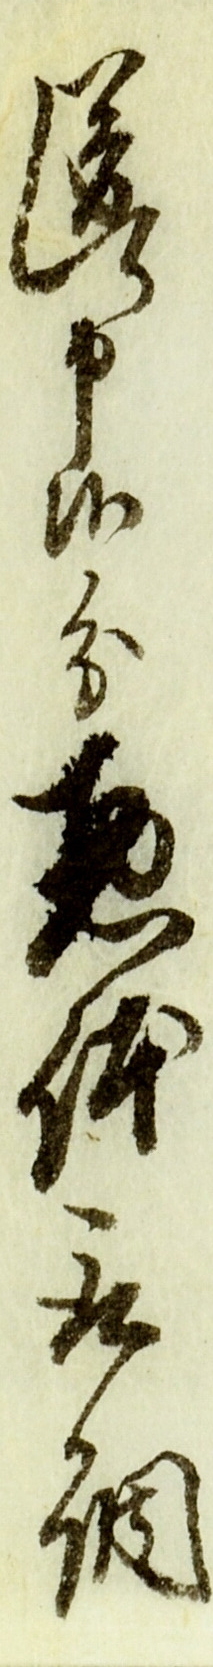送り申候分惣体取調
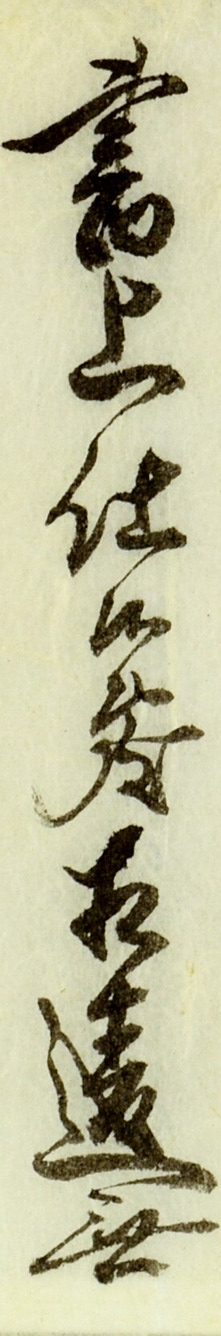書上仕候処相違無
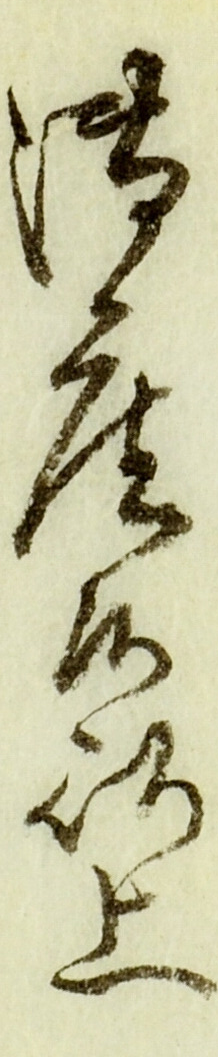御座候以上
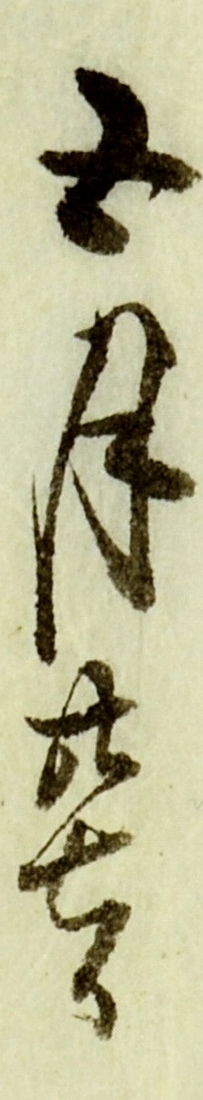五月廿七日
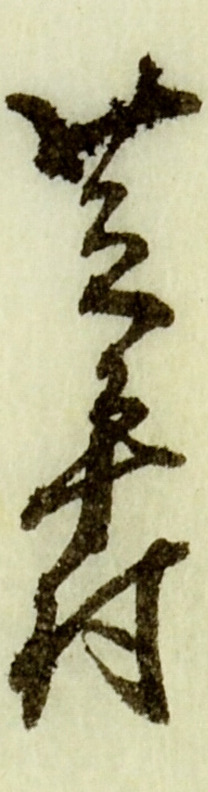芝平村

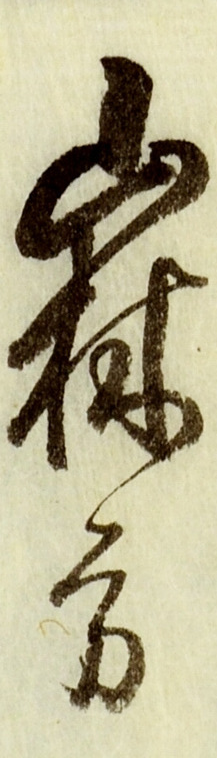山林方
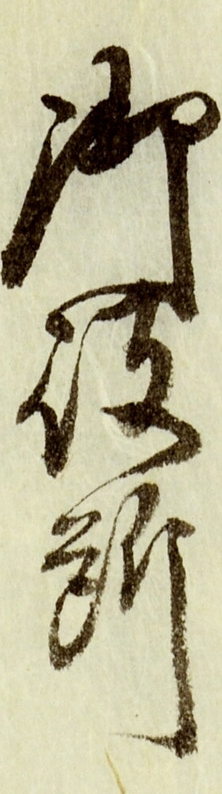御役所
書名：石灰取調書上帳
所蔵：伊那市立高遠町図書館・合同会社AMANE
